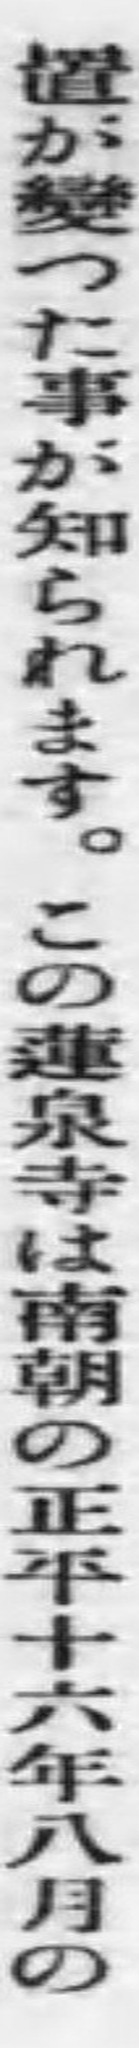置が変つた事が知られます。この蓮泉寺は南朝の正平十六年八月の
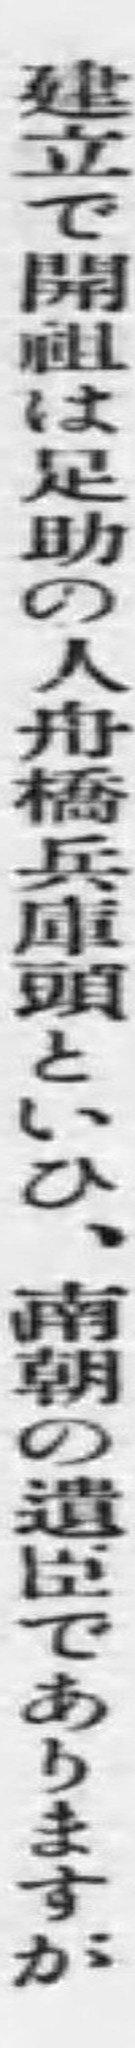建立で開祖は足助の人舟橋兵庫頭といひ、南朝の遺臣でありますが
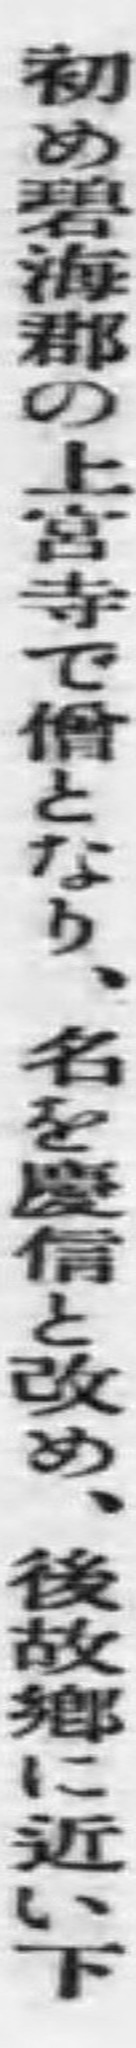初め碧海郡の上宮寺で僧となり、名を慶信と改め、後故郷に近い下
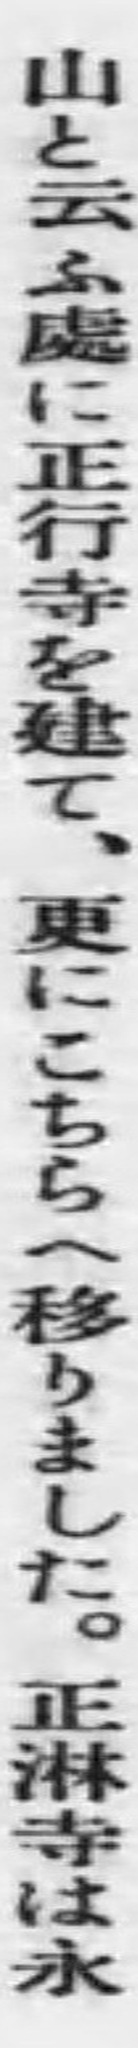山と云ふ処に正行寺を建て、更にこちらへ移りました。正淋寺は永
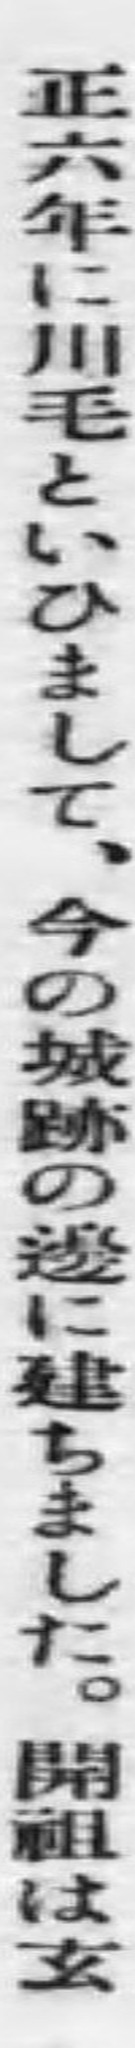正六年に川毛といひまして、今の城跡の辺に建ちました。開祖は玄
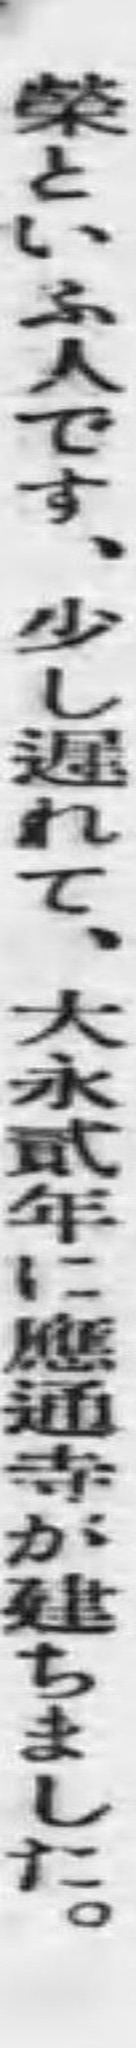栄といふ人です、少し遅れて、大永弐年に応通寺が建ちました。
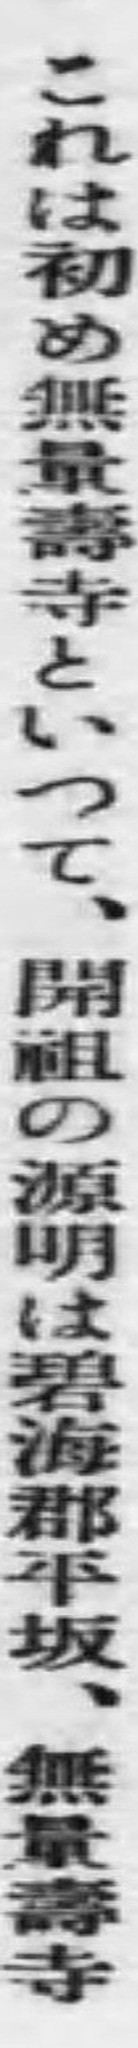これは初め無量寿寺といつて、開祖の源明は碧海郡平坂、無量寿寺
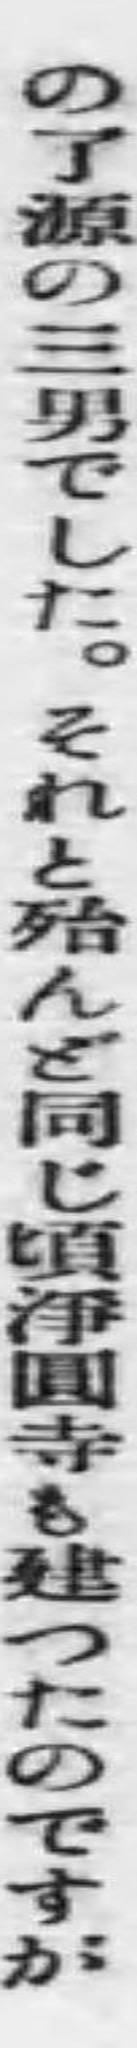の了源の三男でした。それと殆んど同じ頃浄円寺も建つたのですが
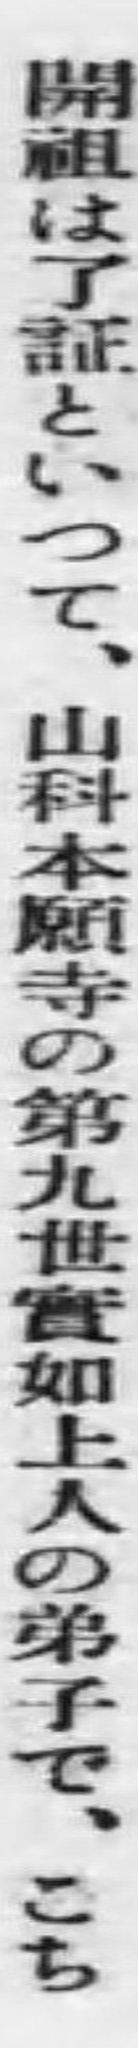開祖は了証といつて、山科本願寺の第九世実如上人の弟子で、こち
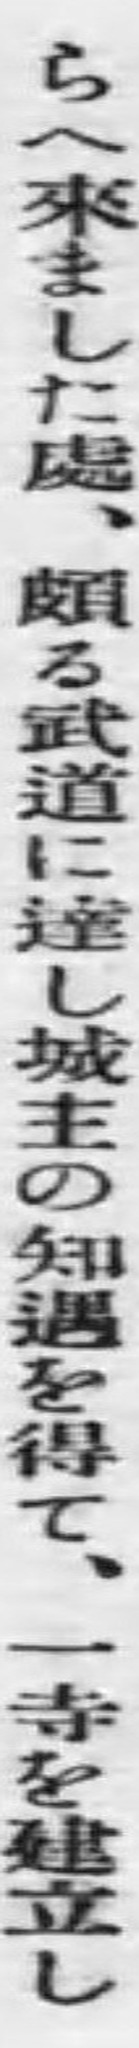らへ来ました処、頗る武道に達し城主の知遇を得て、一寺を建立し
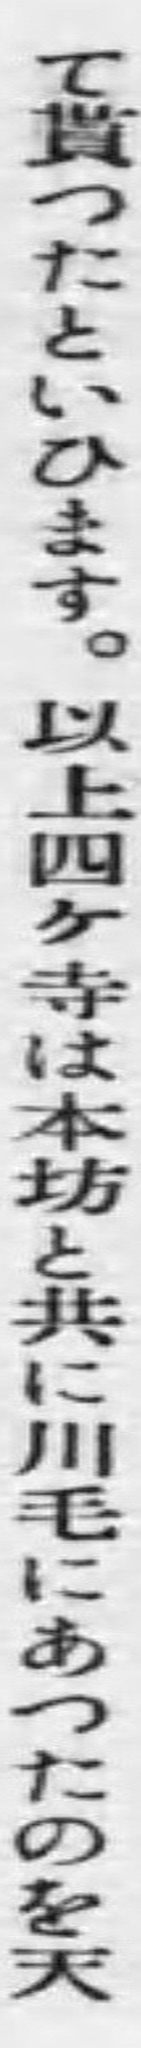て貰つたといひます。以上四ヶ寺は本坊と共に川毛にあつたのを天
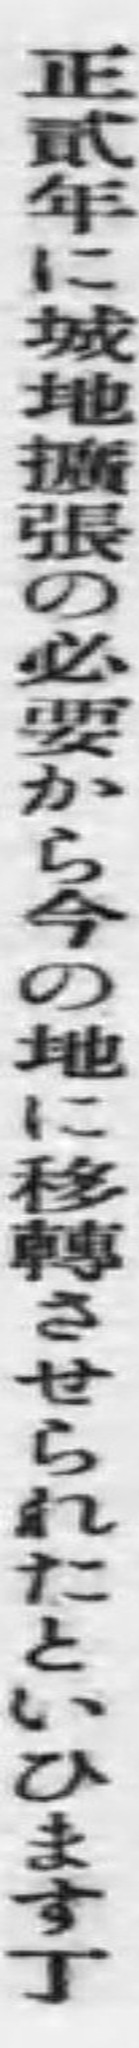正弐年に城地拡張の必要から今の地に移転させられたといひます丁
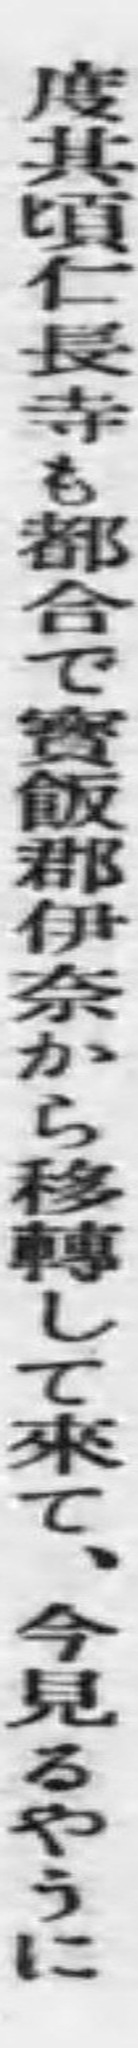度其頃仁長寺も都合で宝飯郡伊奈から移転して来て、今見るやうに
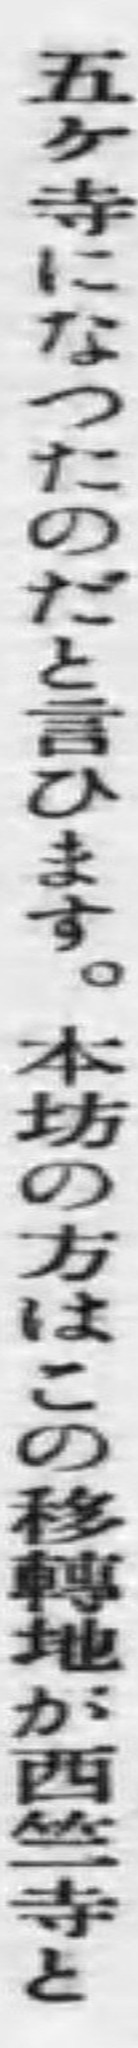五ヶ寺になつたのだと言ひます。本坊の方はこの移転地が西竺寺と
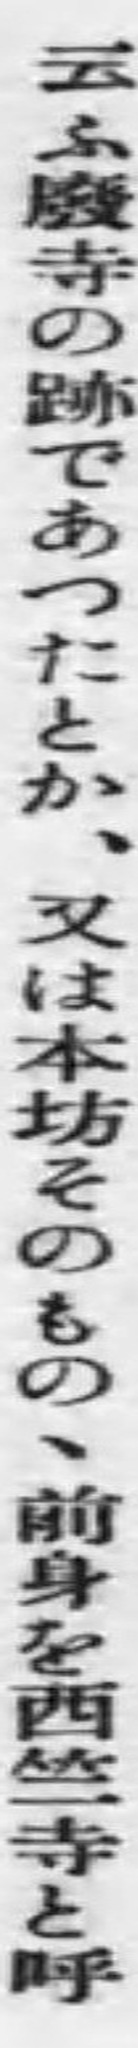云ふ廃寺の跡であつたとか、又は本坊そのものゝ前身を西竺寺と呼
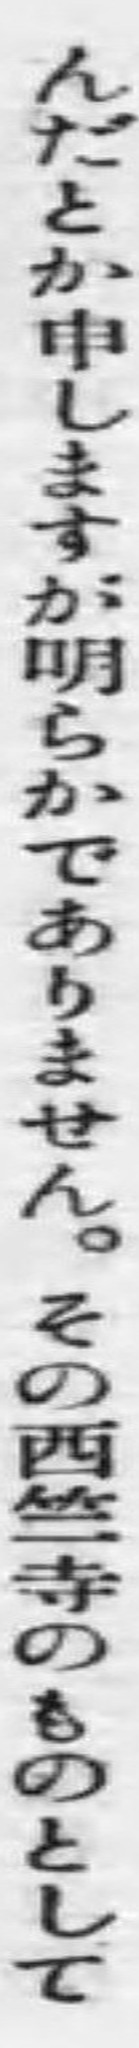んだとか申しますが明らかでありません。その西竺寺のものとして
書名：東三河道中記 : 豊橋市及其附近案内
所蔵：国立国会図書館 National Diet Library, JAPAN
